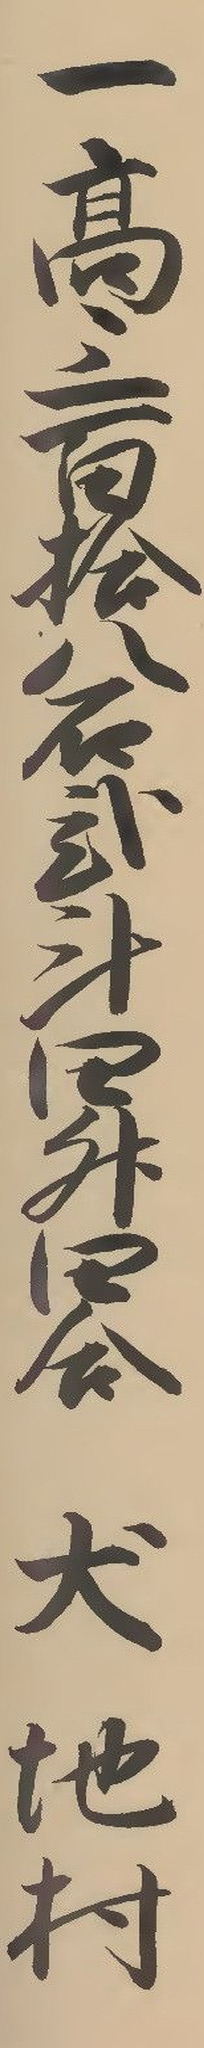一高三百拾八石弐斗四升四合犬地村
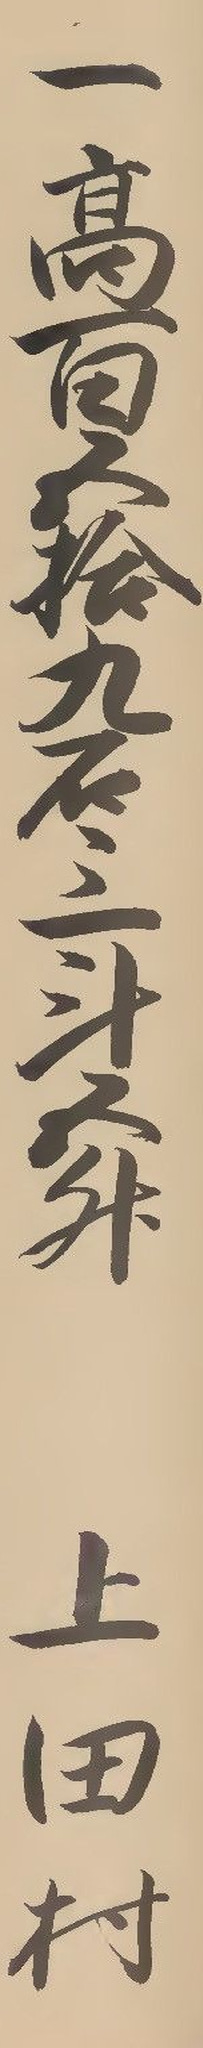一高百五拾九石三斗五升上田村
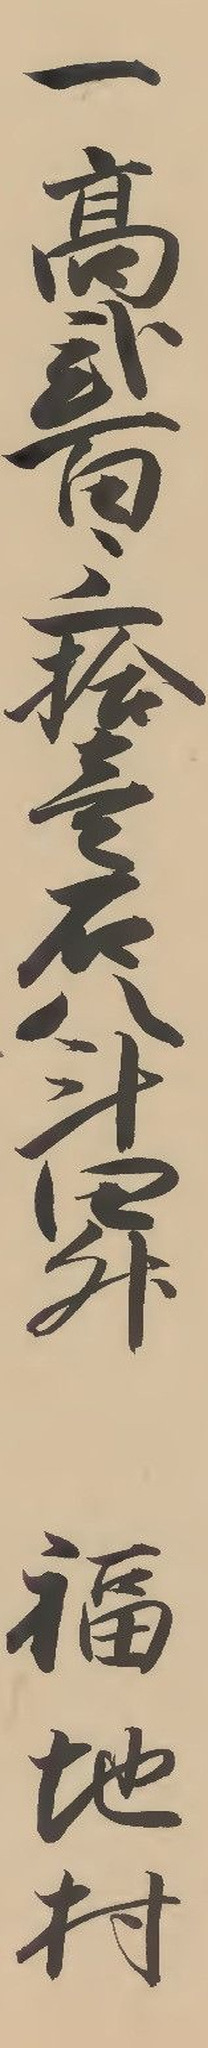一高弐百三拾壱石八斗四升福地村
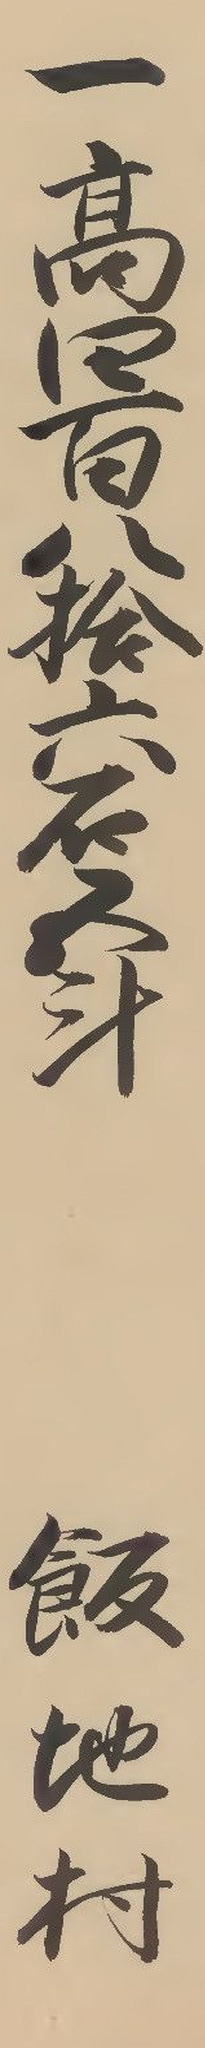一高四百八拾六石五斗飯地村
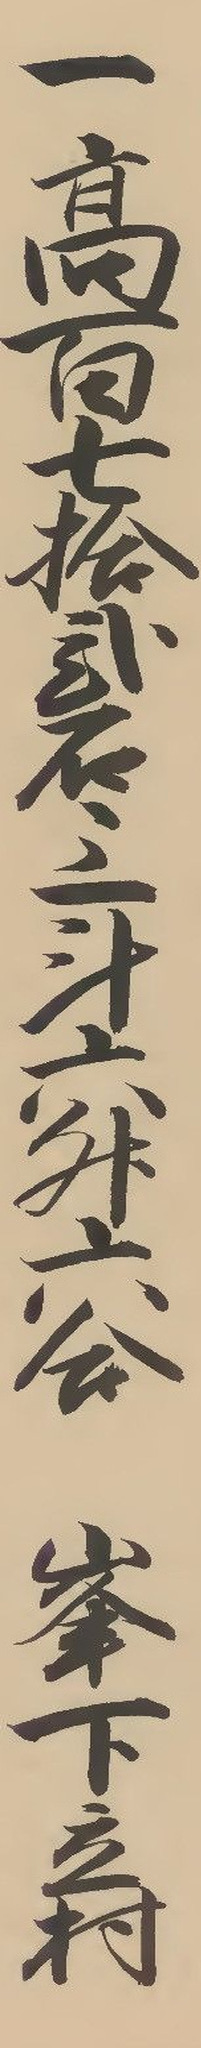一高百七拾弐石三斗六升六合峰下立村

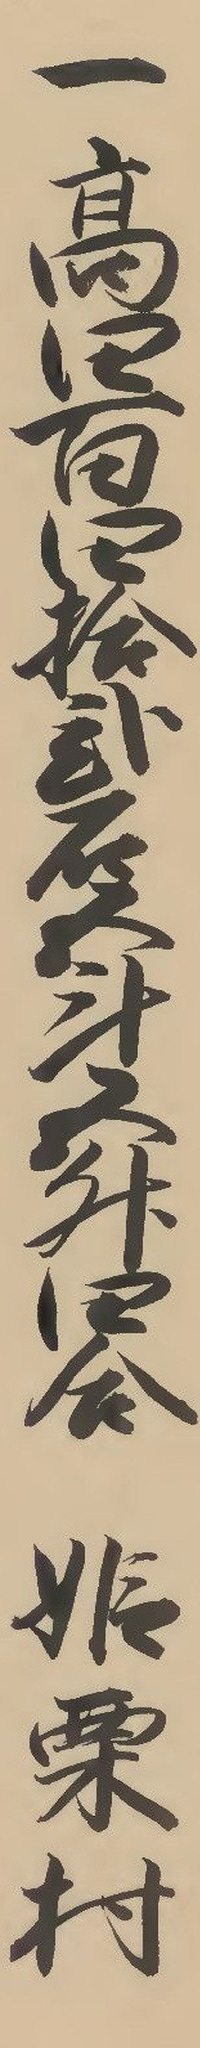一高四百四拾弐石五斗五升四合姫栗村
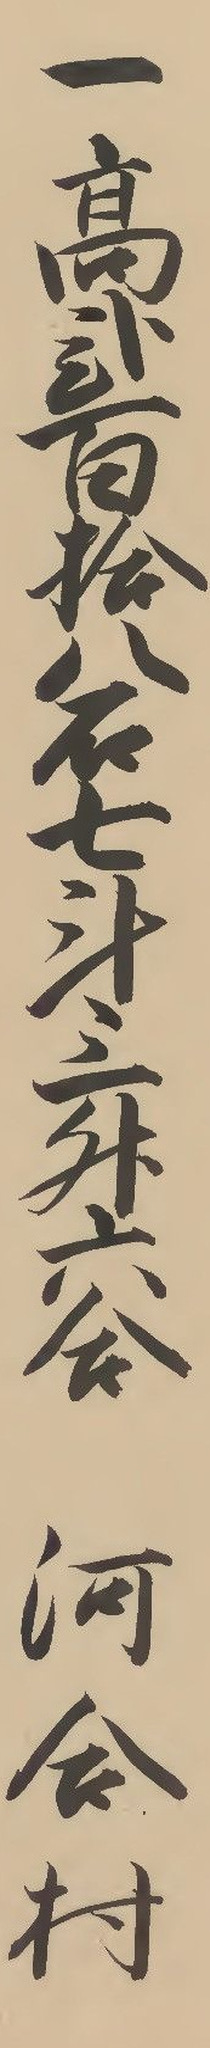一高弐百拾八石七斗三升六合河合村
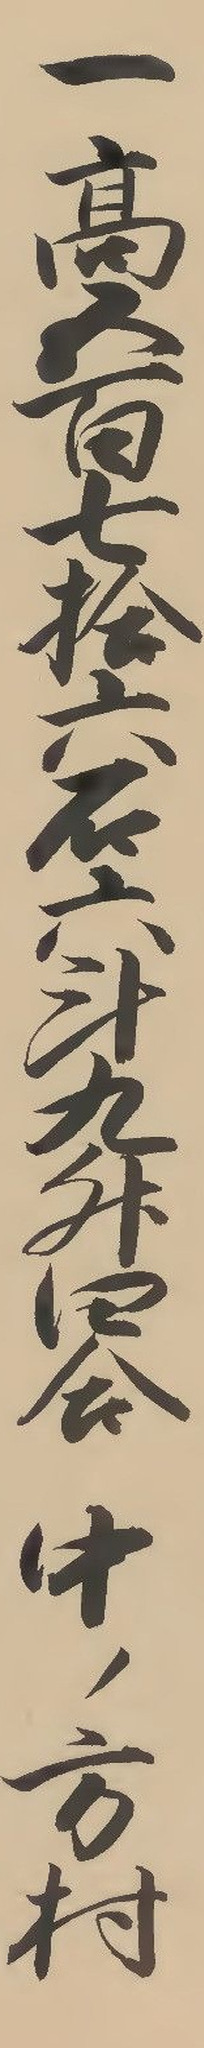一高五百七拾六石六斗九升四合中ノ方村
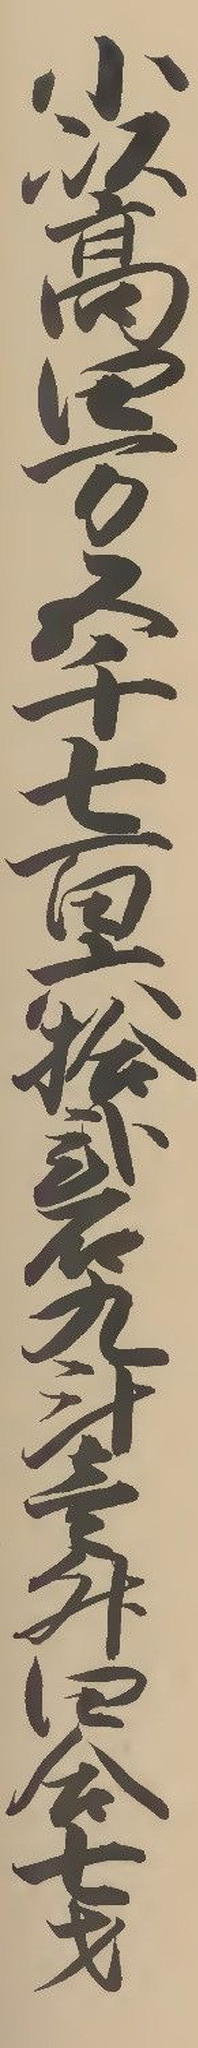小以高四万五千七百六拾弐石九斗壱升四合七才

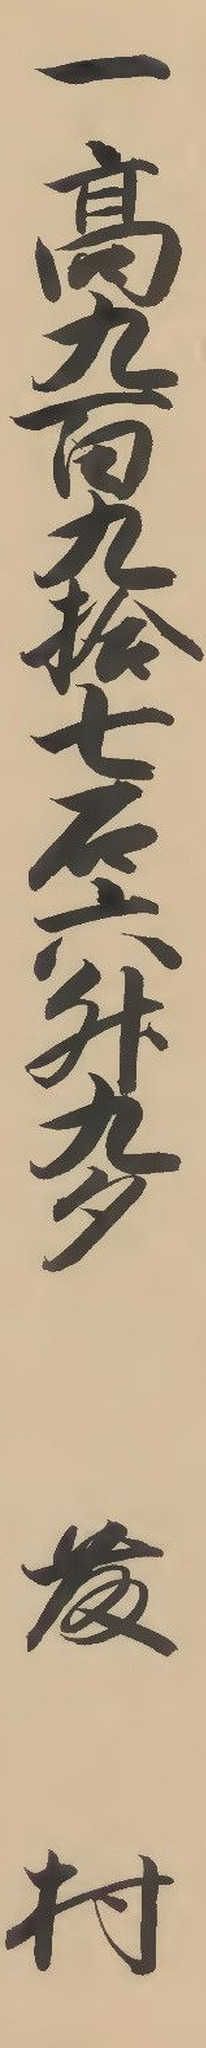一高九百九拾七石六升九勺藤村
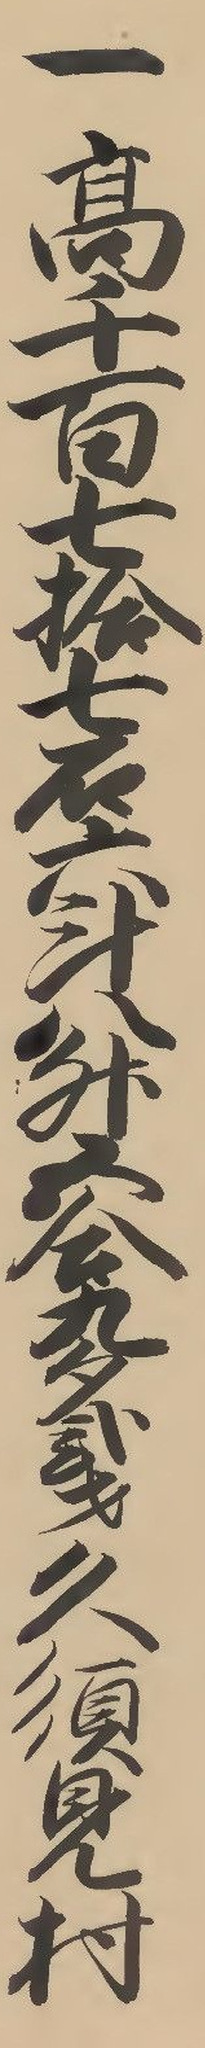一高千百七拾七石六斗八升五合九勺弐才久須見村
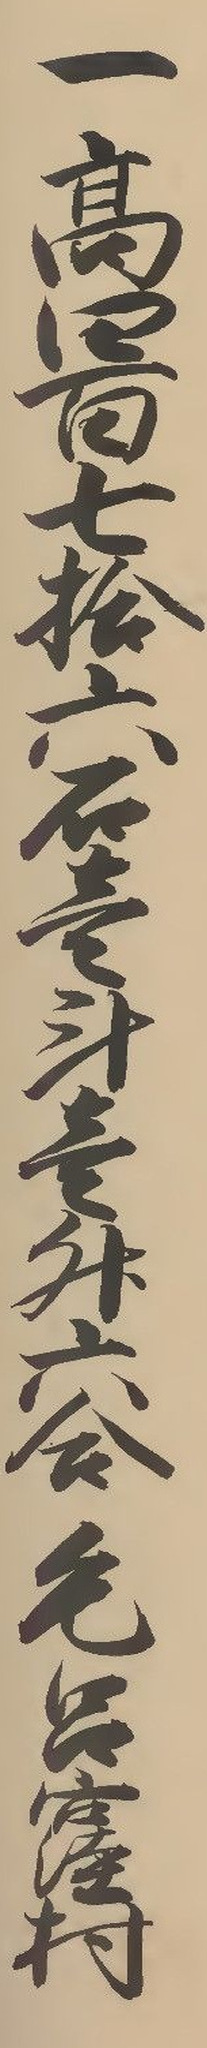一高四百七拾六石壱斗壱升六合毛呂窪村
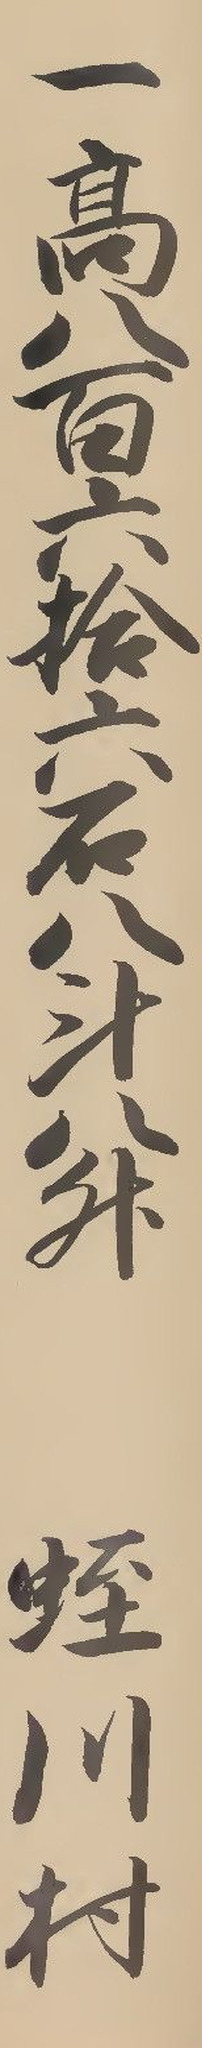一高八百六拾六石八斗八升蛭川村
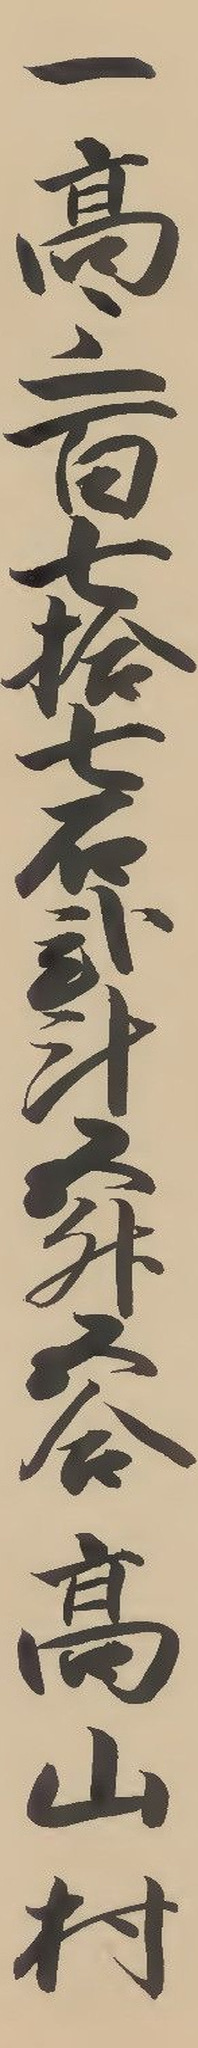一高三百七拾七石弐斗五升五合高山村
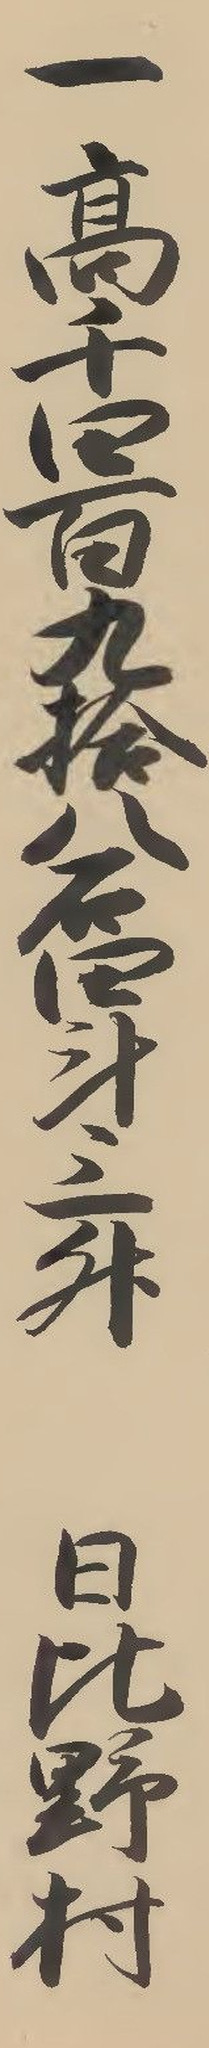一高千四百九拾八石四斗三升日比野村
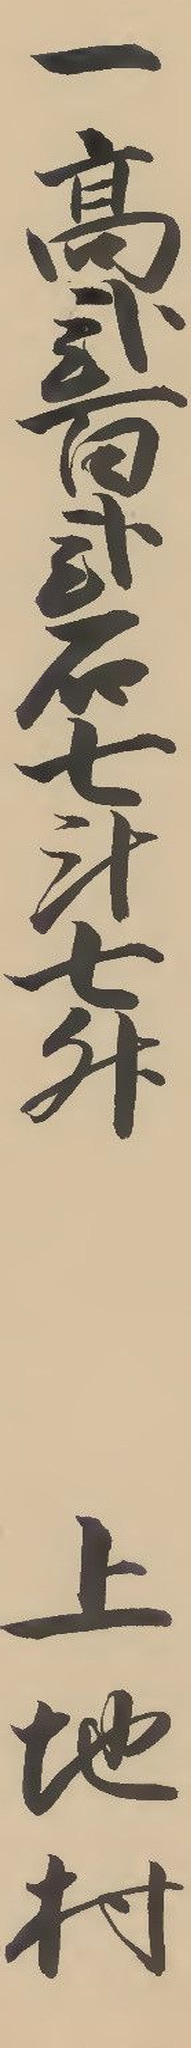一高弐百弐石七斗七升上地村
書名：美濃国郷帳
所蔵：国立公文書館 National Archives of Japan
